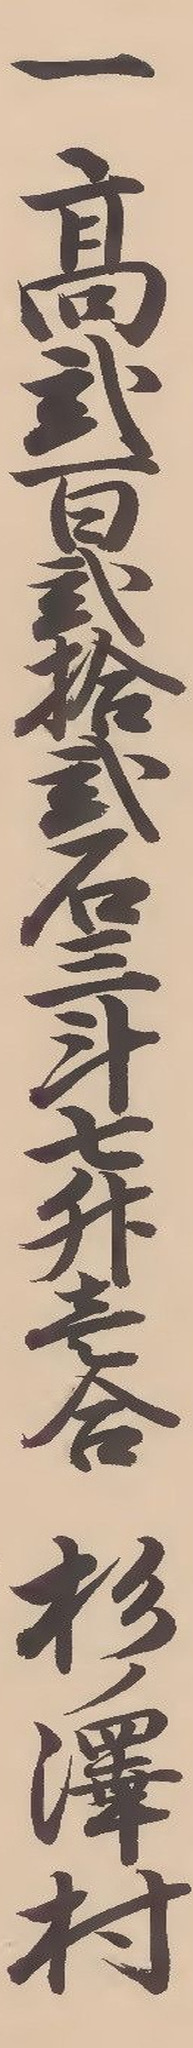一高弐百弐拾弐石三斗七升壱合杉ノ沢村

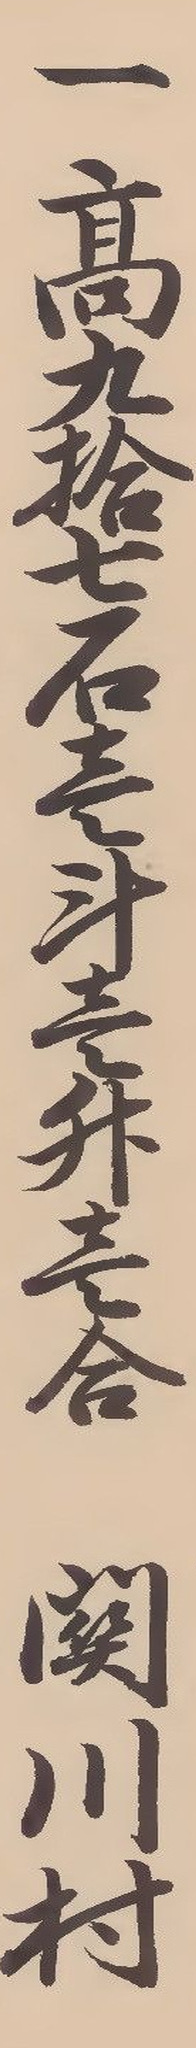一高九拾七石壱斗壱升壱合関川村
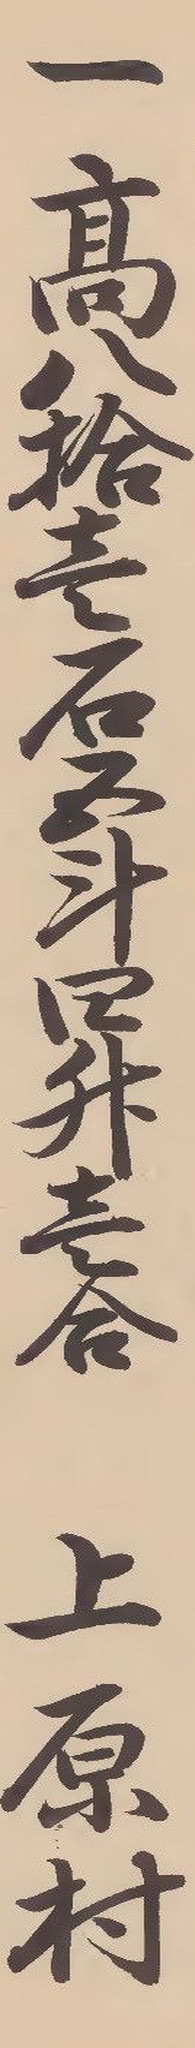一高八拾壱石五斗四升壱合上原村
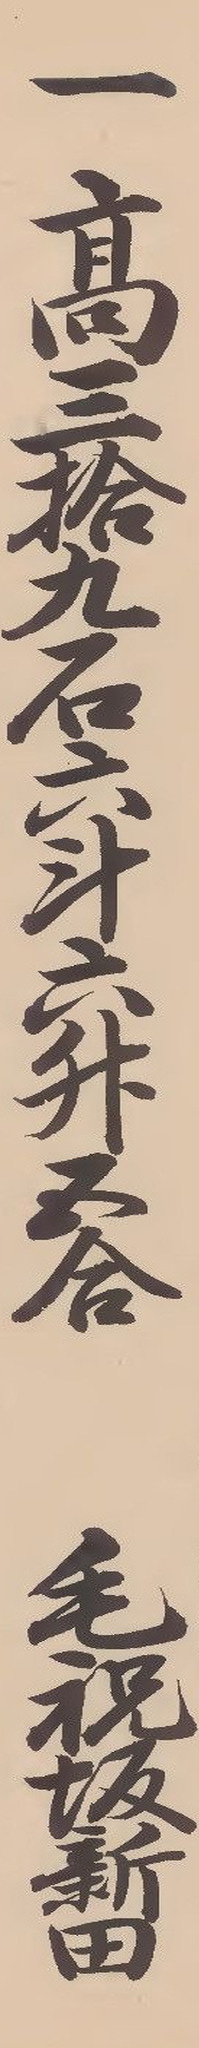一高三拾九石六斗六升五合毛祝坂新田
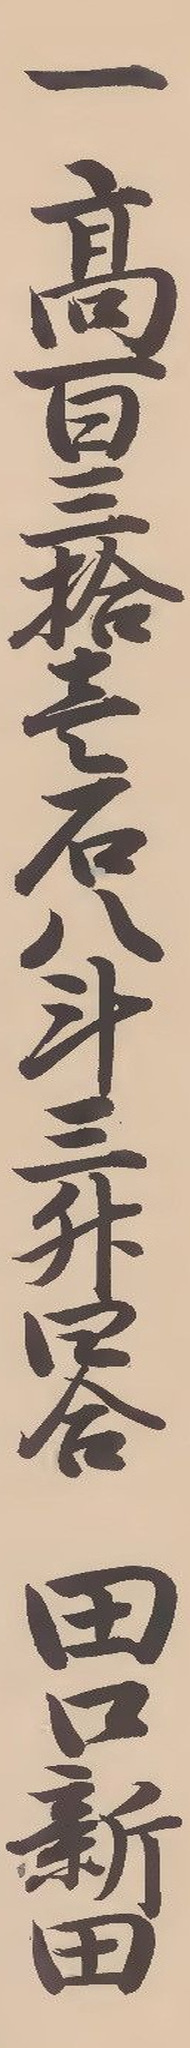一高百三拾壱石八斗三升四合田口新田
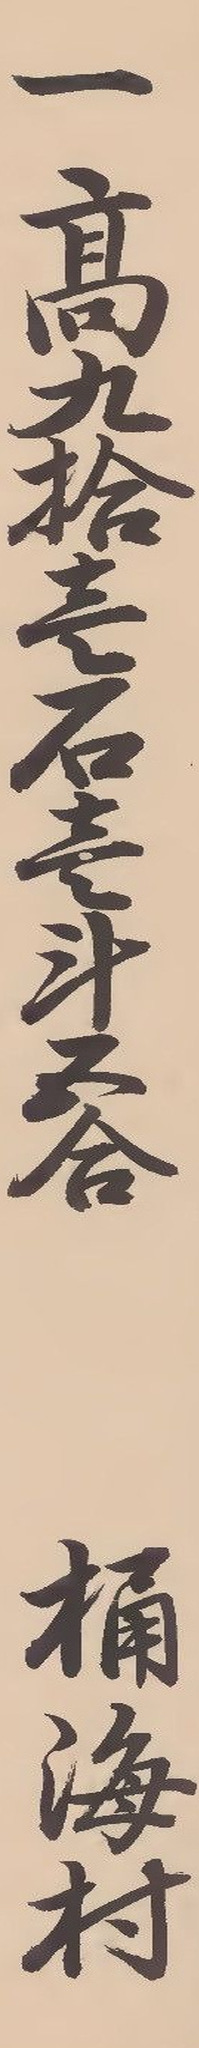一高九拾壱石壱斗五合桶海村
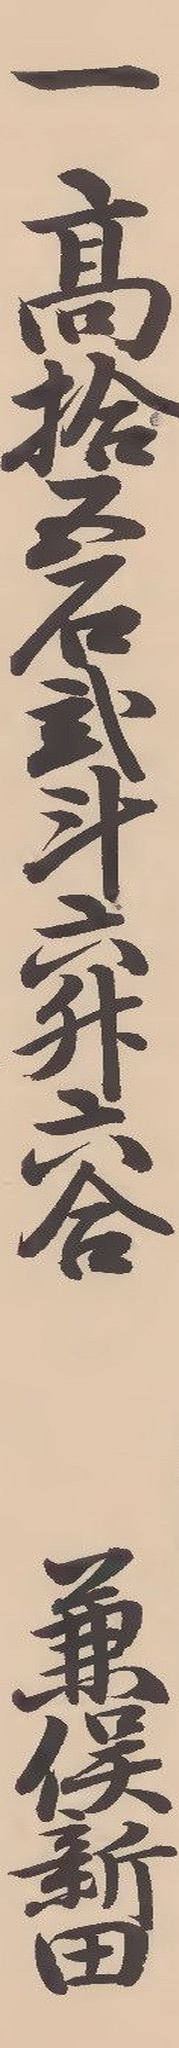一高拾五石弐斗六升六合兼俣新田
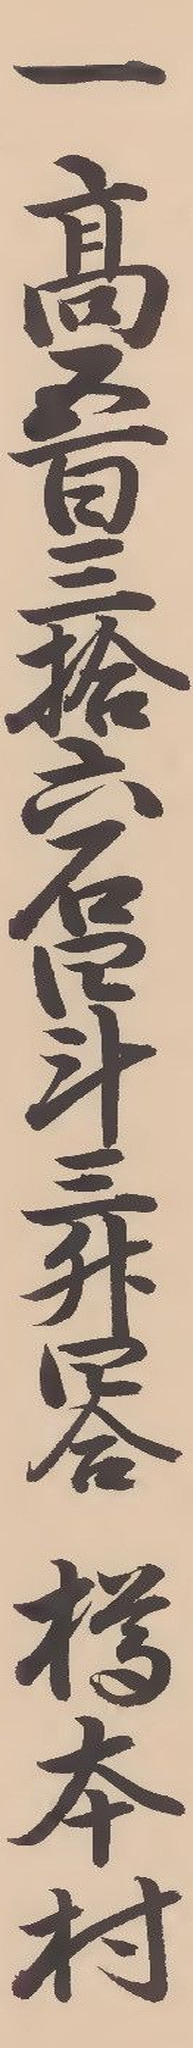一高五百三拾六石四斗三升四合樽本村
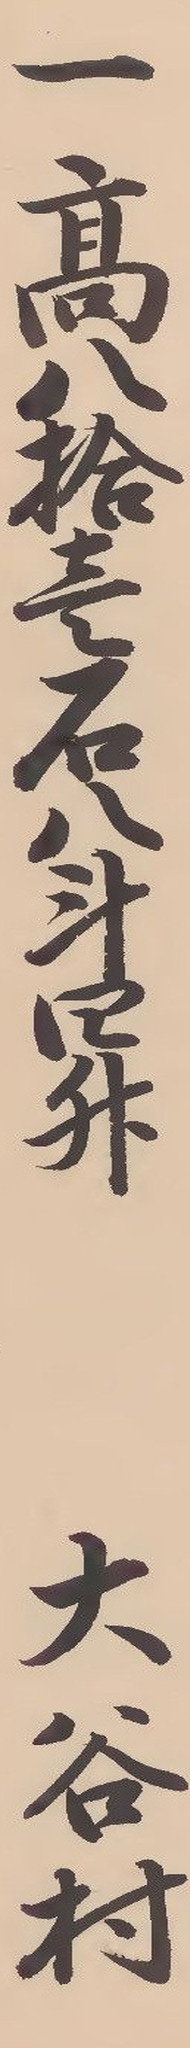一高八拾壱石八斗四升大谷村

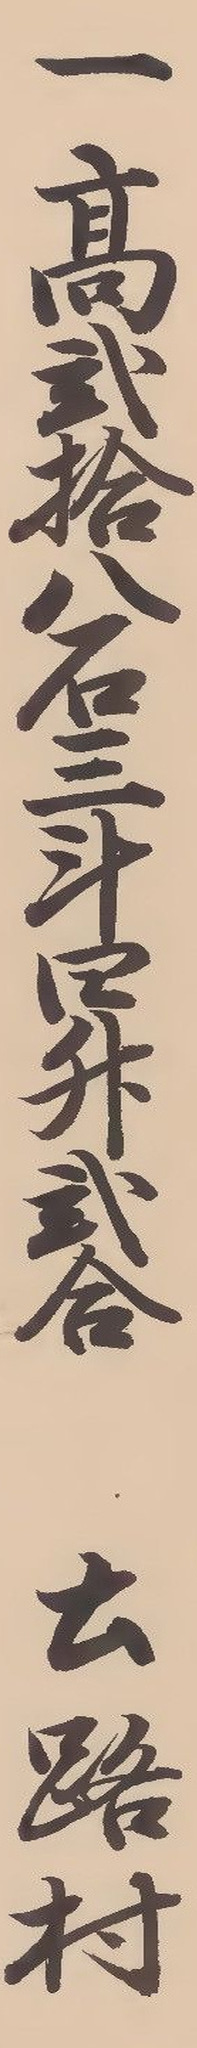一高弐拾八石三斗四升弐合土路村
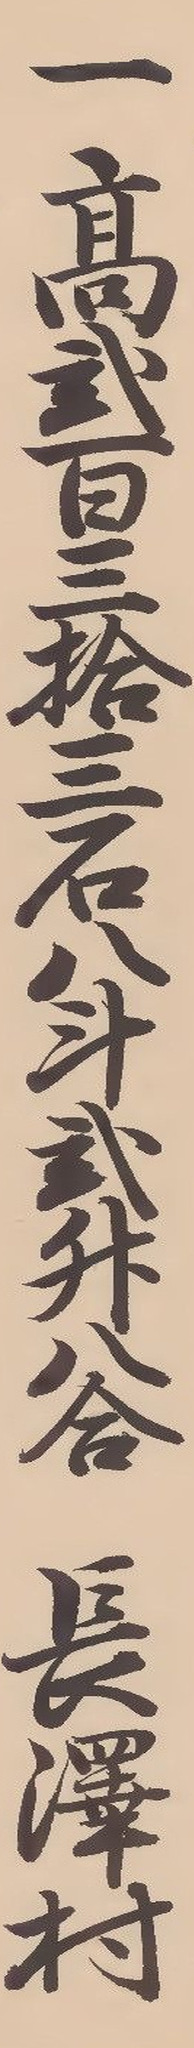一高弐百三拾三石八斗弐升八合長沢村
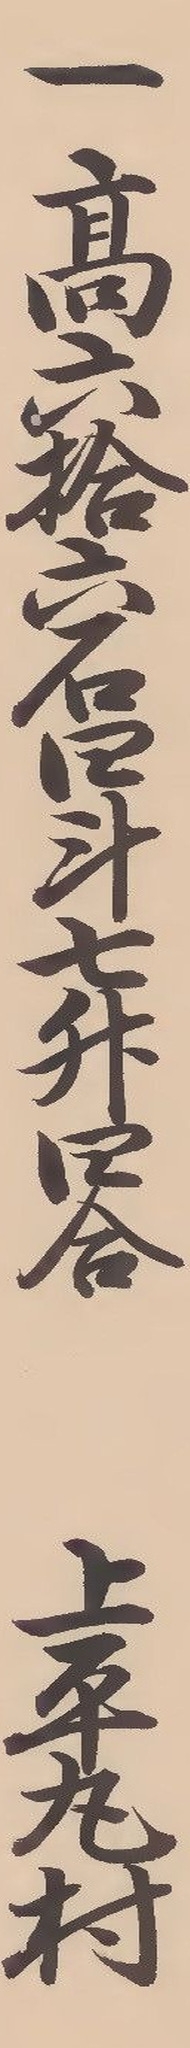一高六拾六石四斗七升四合上平丸村
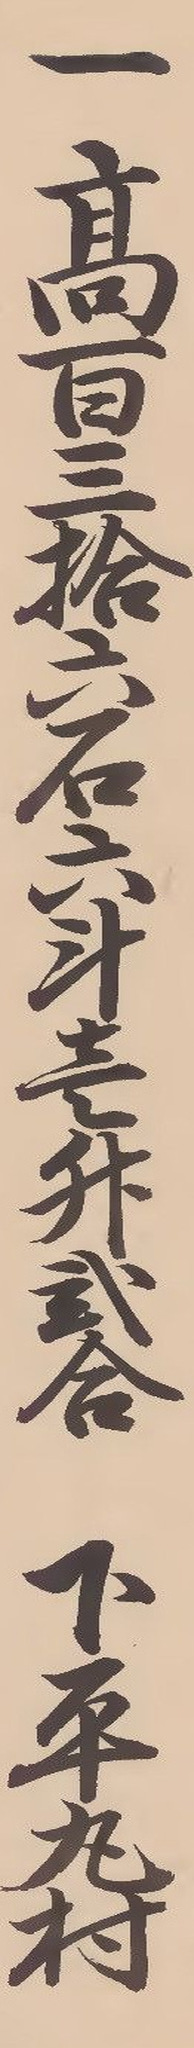一高百三拾六石六斗壱升弐合下平丸村
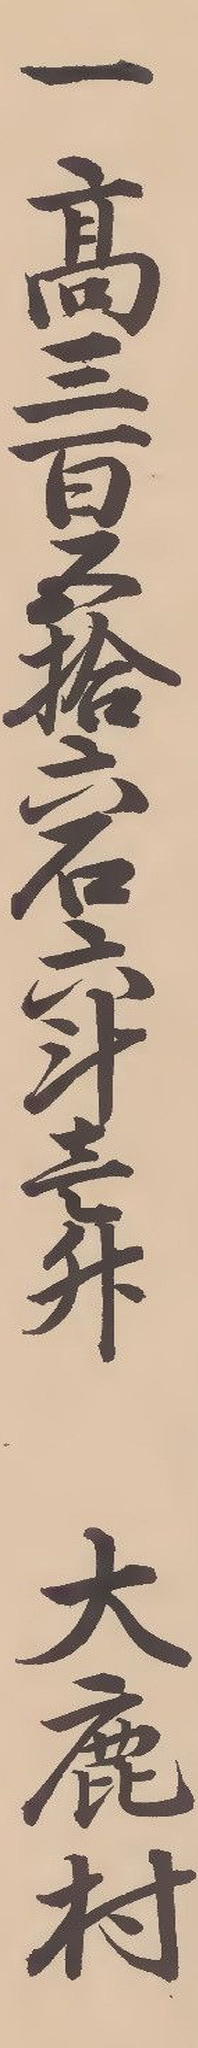一高三百五拾六石六斗壱升大鹿村
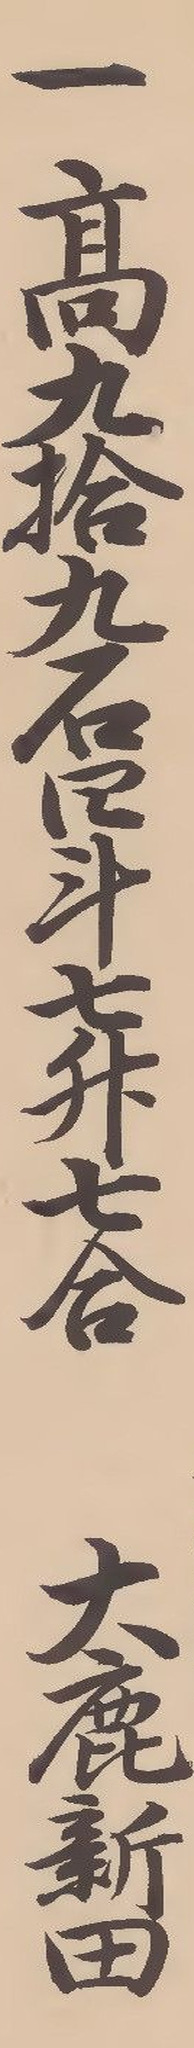一高九拾九石四斗七升七合大鹿新田
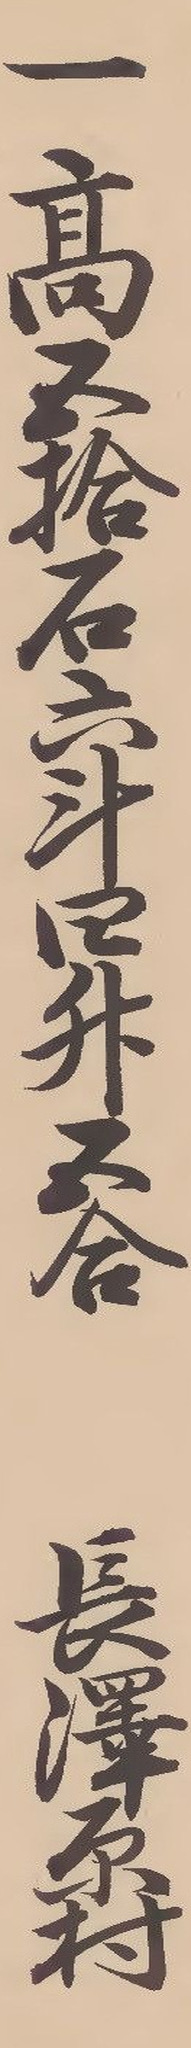一高五拾石六斗四升五合長沢原村
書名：越後国郷帳　上
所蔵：国立公文書館 National Archives of Japan
